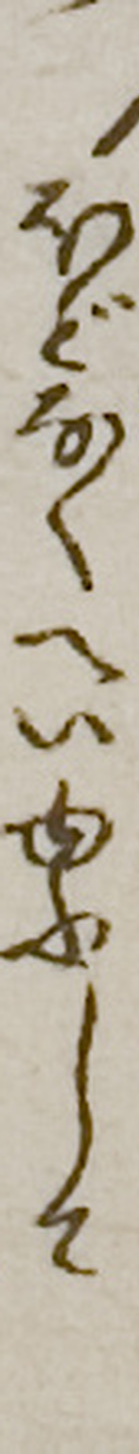ほどなくへいゆにして
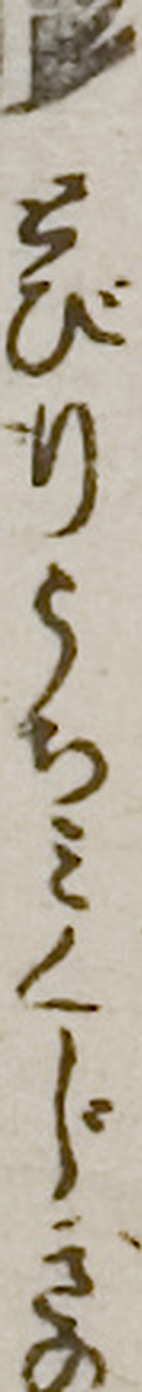とび行うちみくじきの
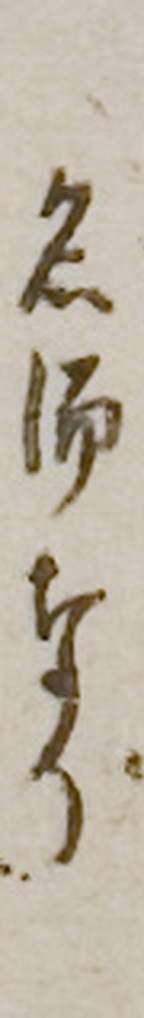名湯なり
